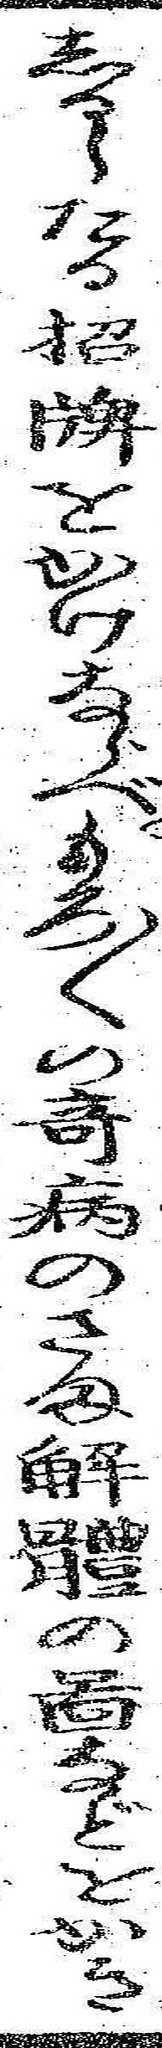しるしたる招牌をかけならべ。もろ〳〵の奇病のさま解体の図などをかき。
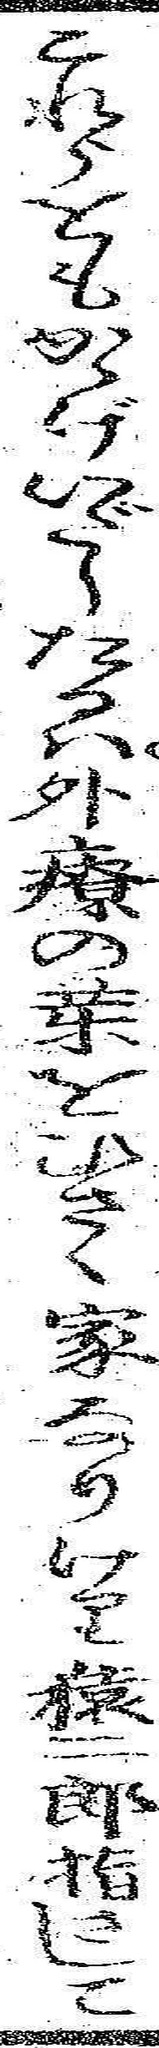これらをもかゝげいだしたるは。外療の薬をひさく家なりけり。猿二郎指さして。
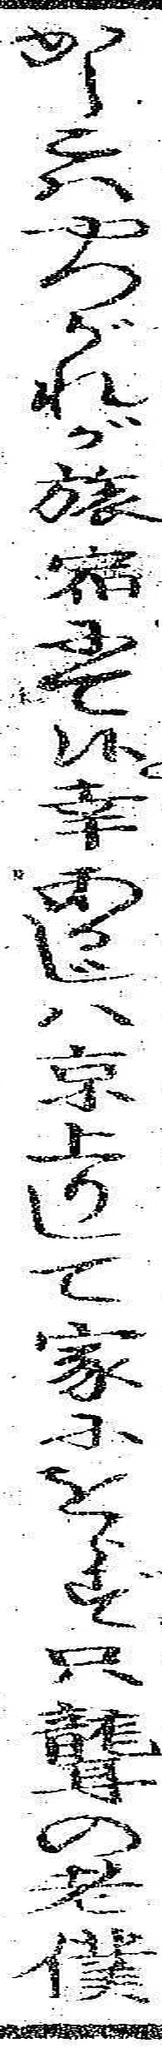かしこはやつがれが旅宿にて候。幸あるじは京上りして家にをらず。只聾の老僕
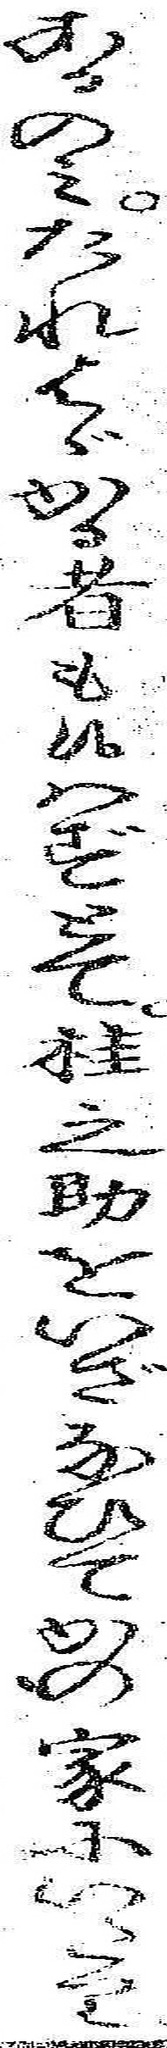あるのみ。たれはゞかる者も候はずとて。桂之助をいざなひてかの家にいたり。
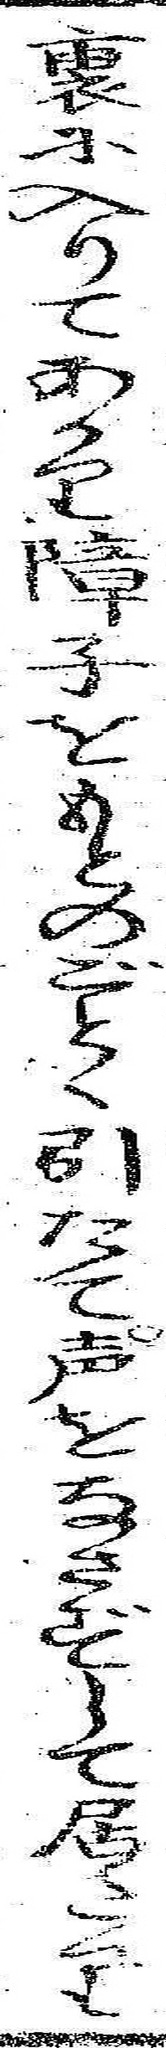裏に入りてあかり障子をもとのごとく引たて。声をなさずして居たり
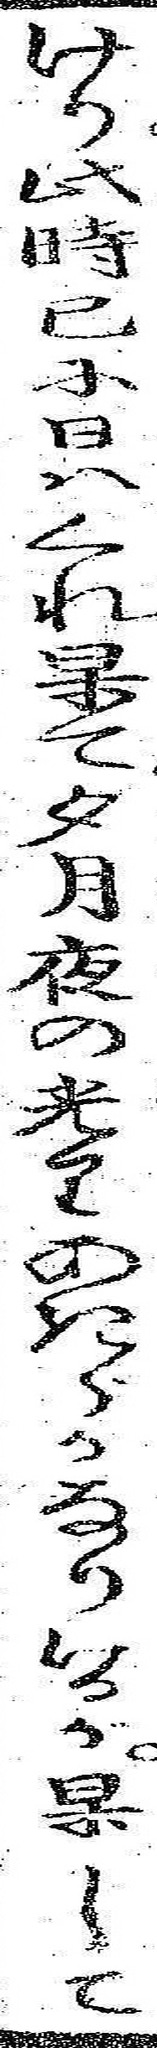けり。此時已に日はくれ果て。夕月夜の光りあきらかなりけるが。果して
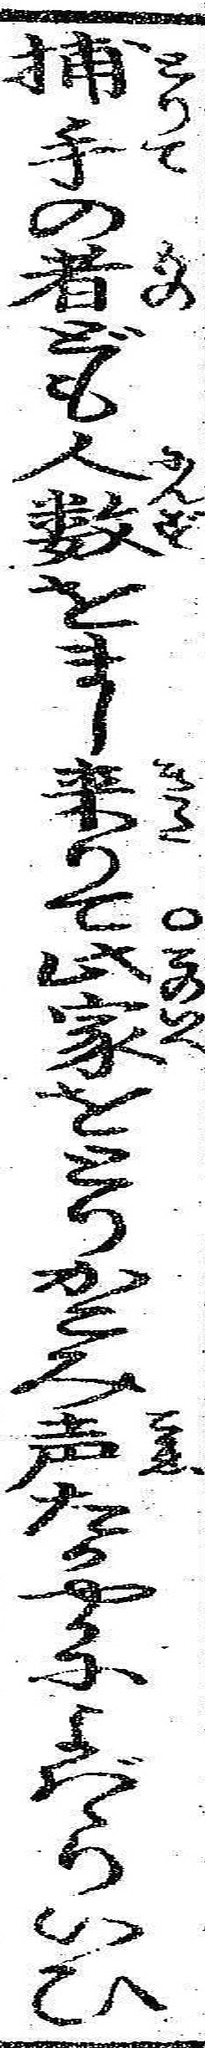捕手の者ども人数をまし来りて。此家をとりかこみ声たかやかによばゝりいひ
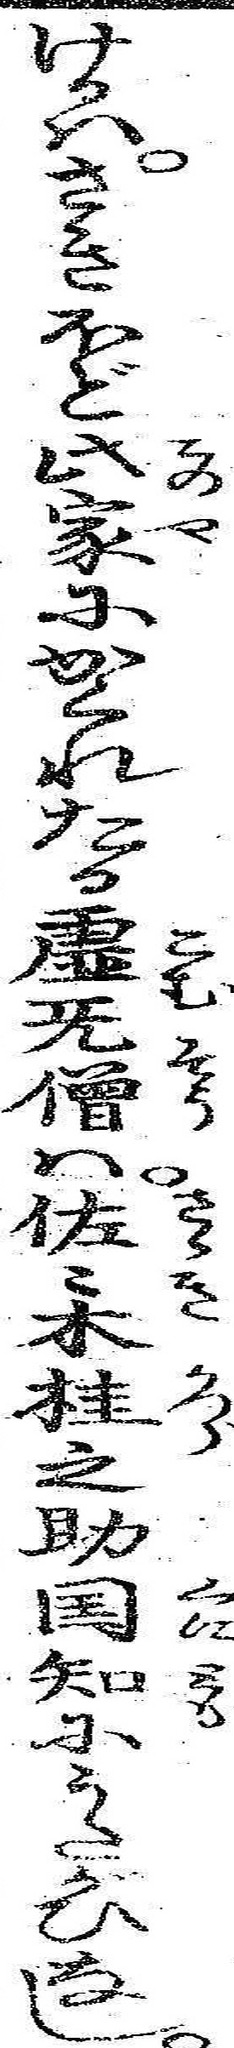けるは。さきほど此家にかくれたる虚無僧は。佐々木桂之助国知にうたがひなし。
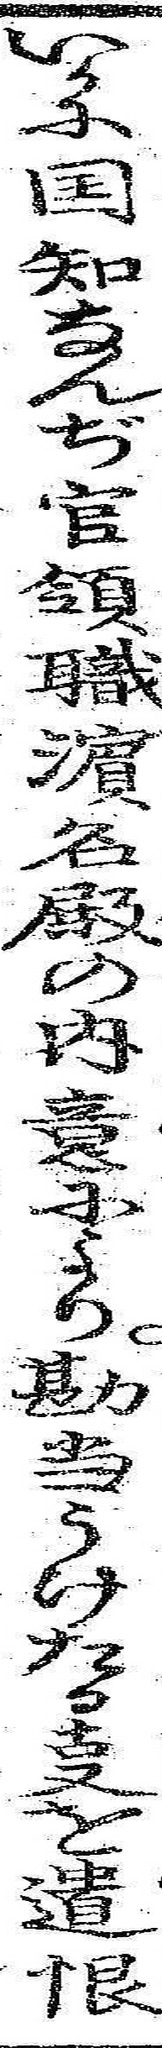いかに国知なんぢ官領職浜名殿の内意により。勘当うけたる事を遺恨
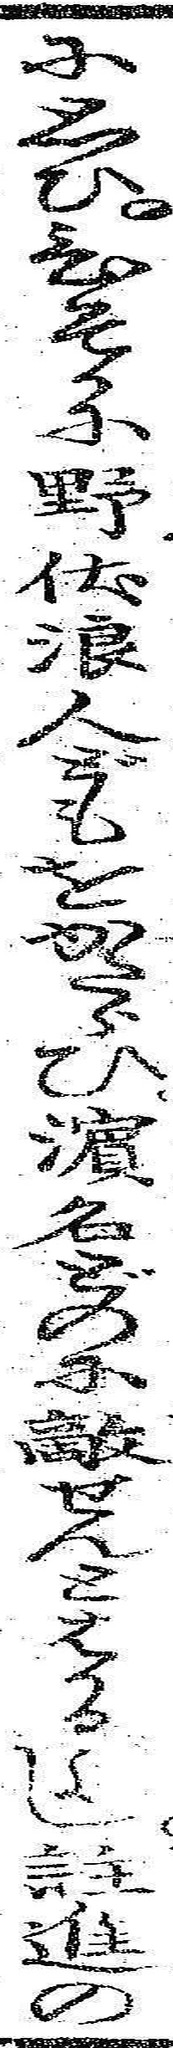に思ひ。ひそかに野伏浪人どもをかたらひ。浜名どのに敵せんとはかるよし。註進の
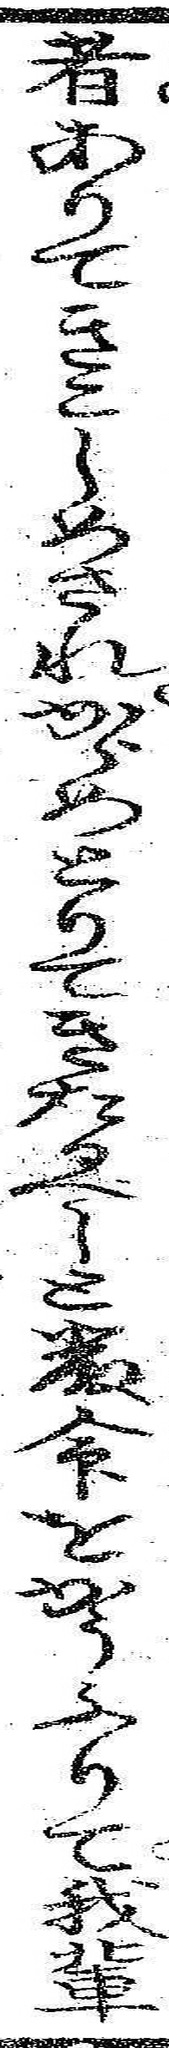者ありてきこしめされ。からめとりてきたるべしと厳命をかうふりて。我輩
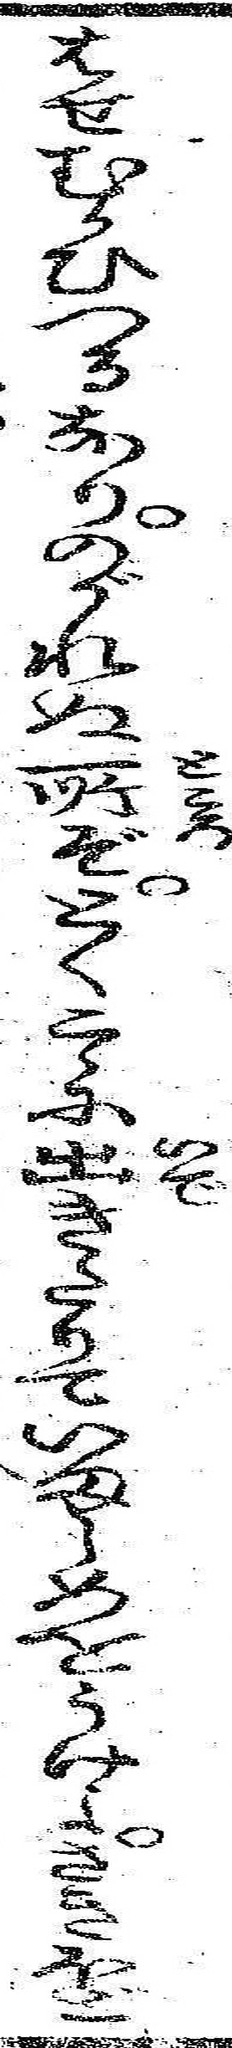はせむかひつるなり。のがれぬ所ぞ。とくこゝに出きたりていましめをうけよ。さきほど
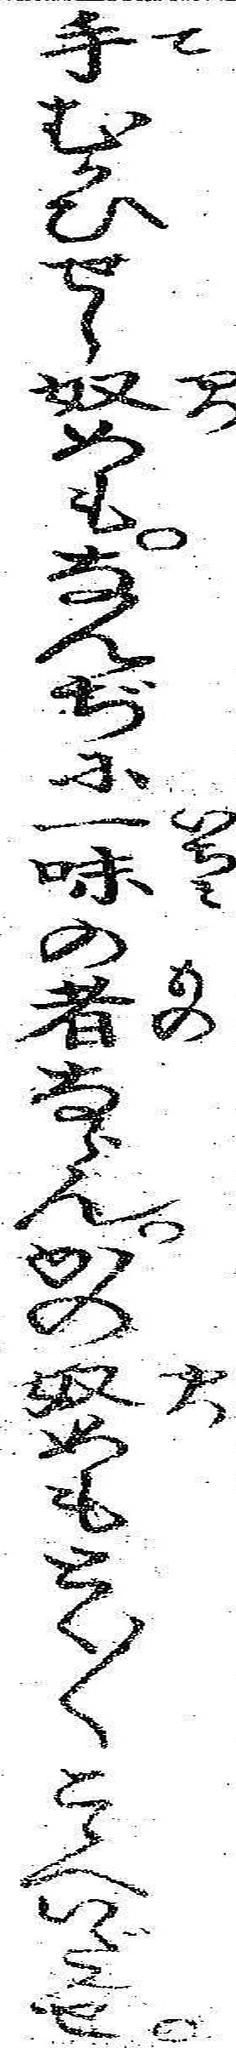手むかひせし奴めも。なんぢに一味の者ならん。かの奴めもとく〳〵こゝへいだせ。
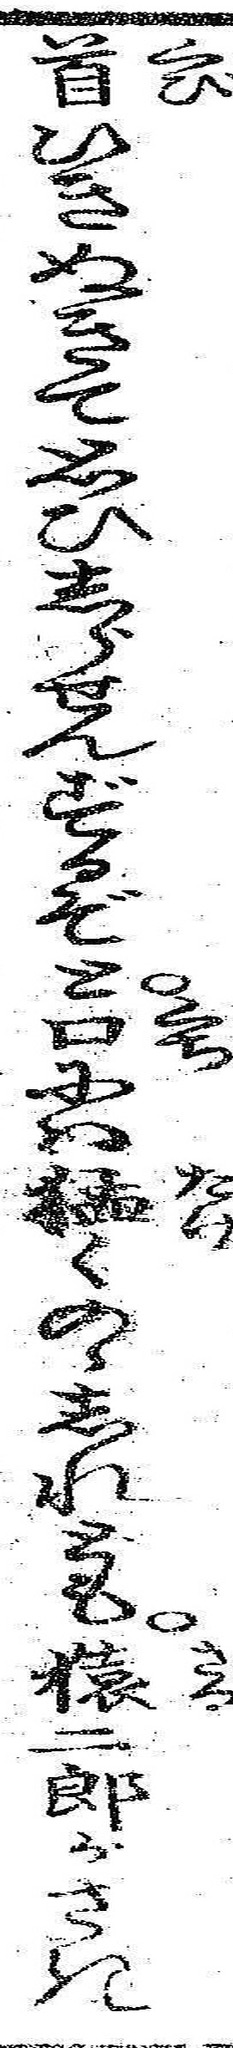首ひきぬきて思ひしらせんずるぞと。口には猛くのゝしれども。猿二郎がさき
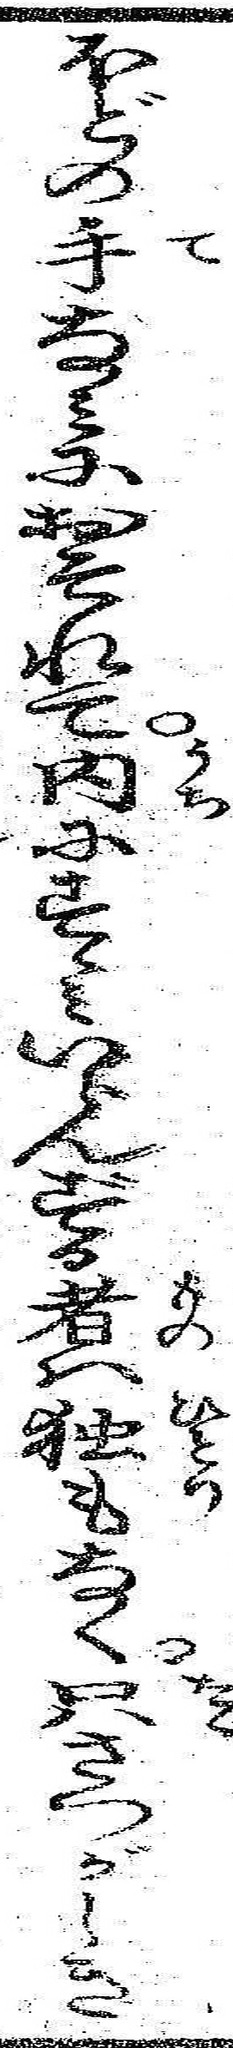ほどの手なみにおそれて。内にすゝみいらんずる者は独もなく。只さわがしき
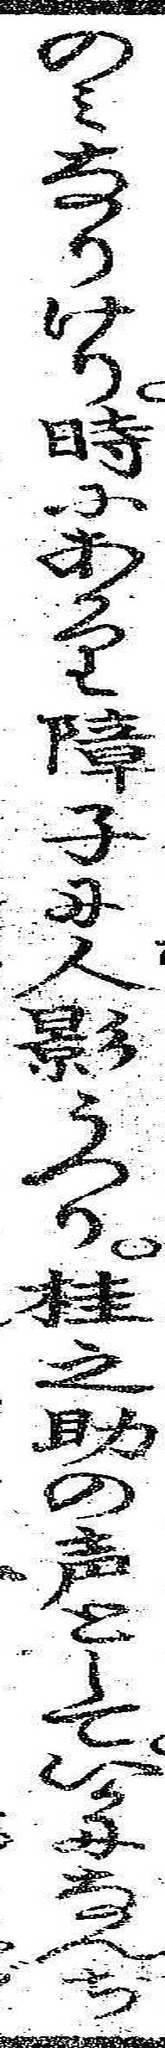のみなりけり。時にあかり障子に人影うつり。桂之助の声として。いかになんぢ
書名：昔話稲妻表紙
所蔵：国文学研究資料館
